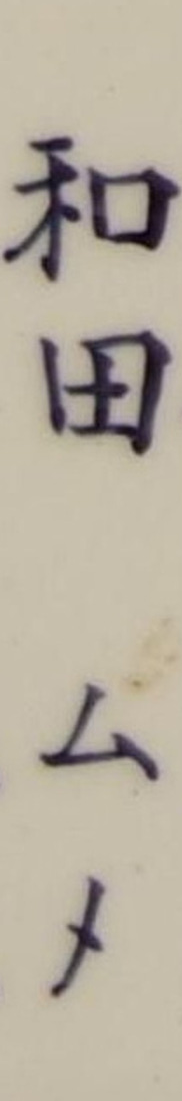和田ムメ

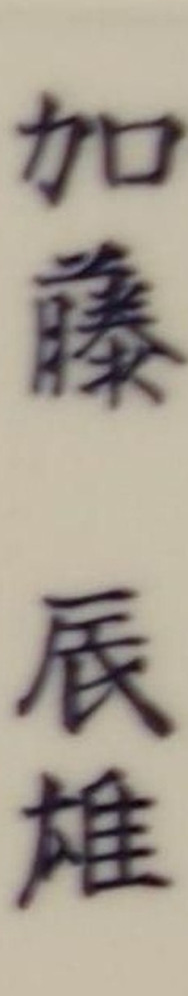加藤辰雄
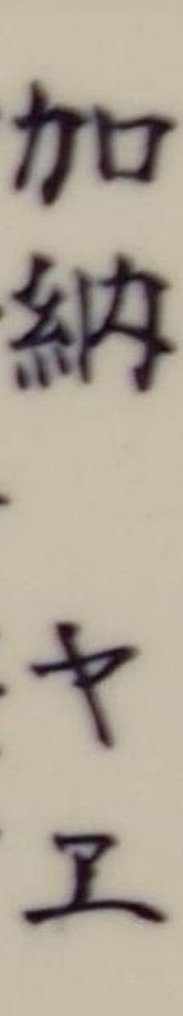加納ヤエ
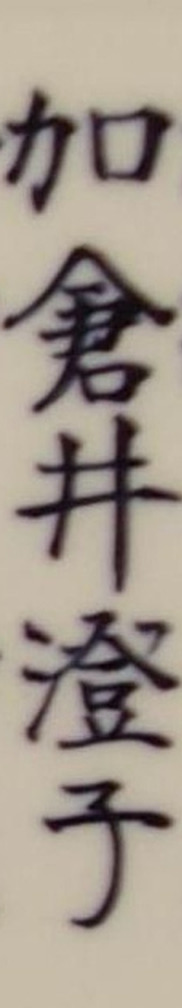加倉井澄子
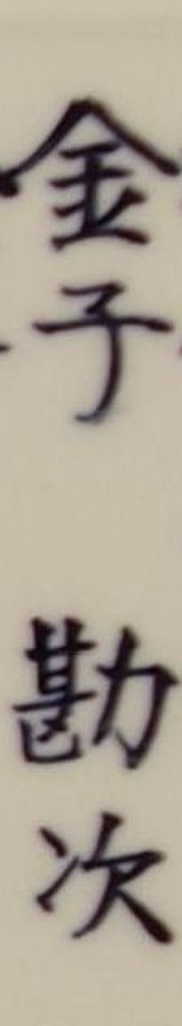金子勘次
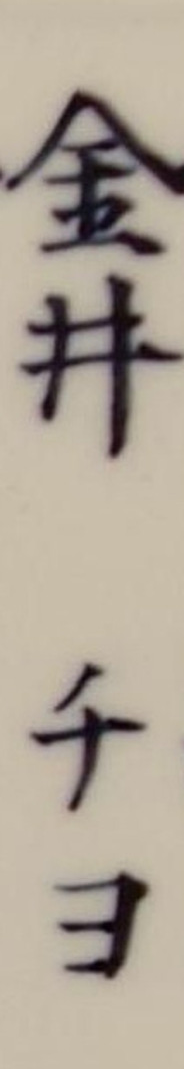金井チヨ
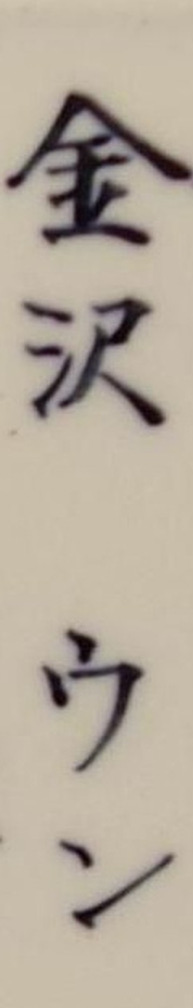金沢ウン
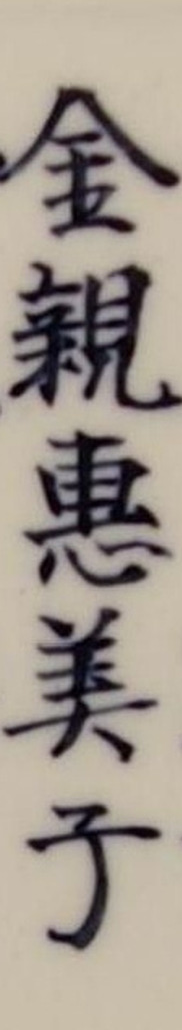金親恵美子
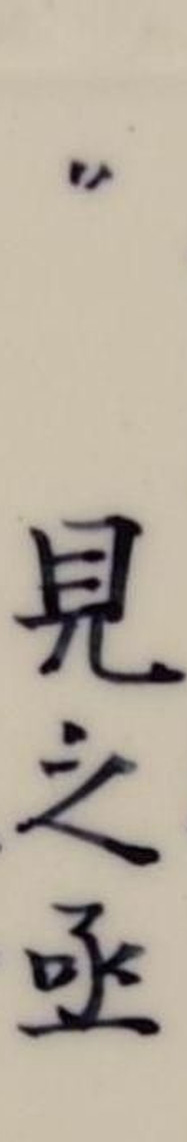見之丞
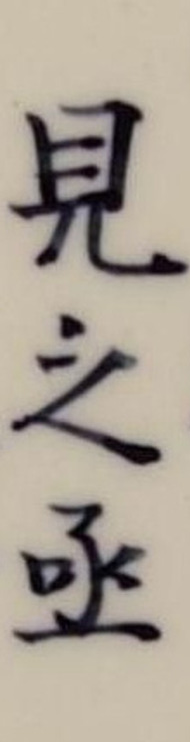見之丞
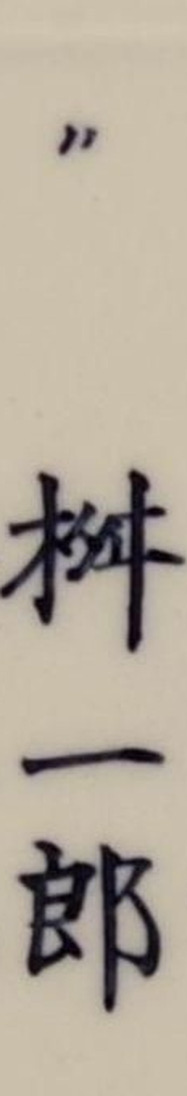桝一郎
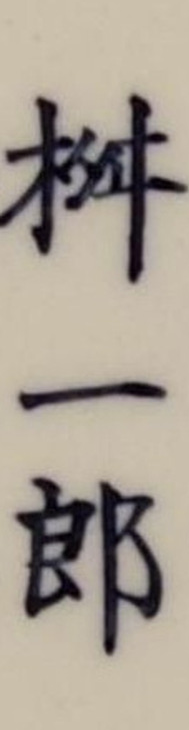桝一郎
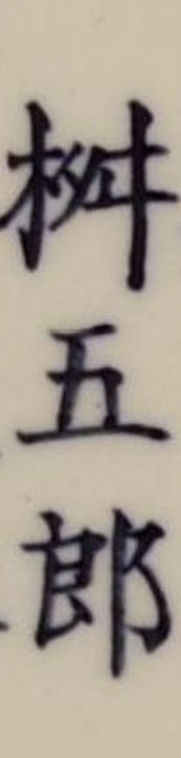桝五郎
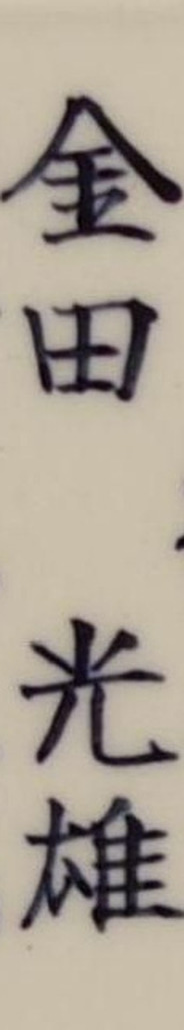金田光雄
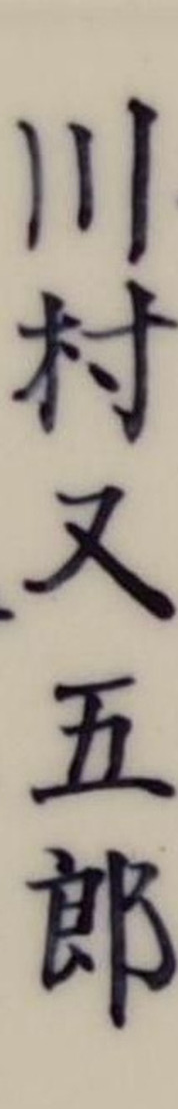川村又五郎
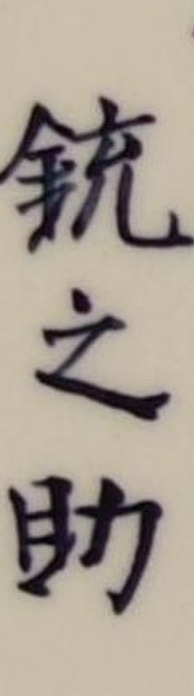銃之助
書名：M~S
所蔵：高野山金剛峯寺
